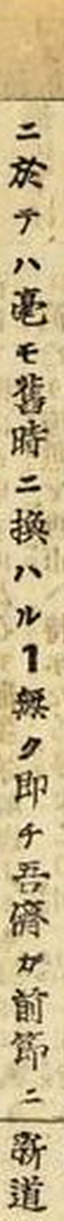ニ於テハ毫モ舊時ニ換ハルヿ無ク即チ吾儕ガ前節ニ
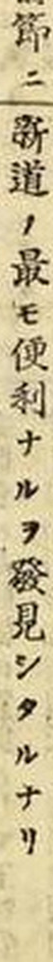新道ノ最モ便利ナルヲ發見シタルナリ
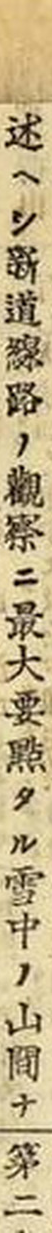述ヘシ新道線路ノ観察ニ最大要點タル雪中ノ山間ナ
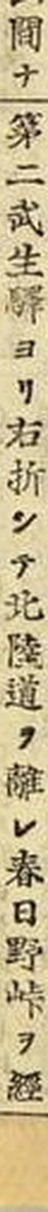第二武生驛ヨリ右折シテ北陸道ヲ離レ春日野峠ヲ經
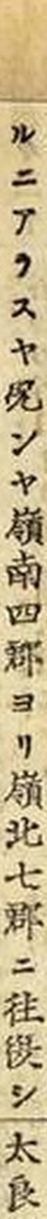ルニアラスヤ况ンヤ嶺南四郡ヨリ嶺北七郡ニ往復シ
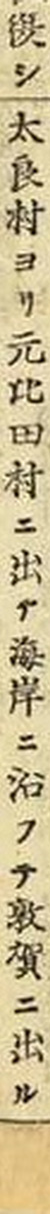太良村ヨリ元比田村ニ出テ海岸ニ沿フテ敦賀ニ出ル
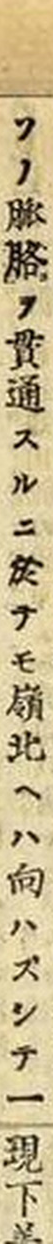ソノ脈胳ヲ貫通スルニ於テモ嶺北ヘハ向ハズシテ一
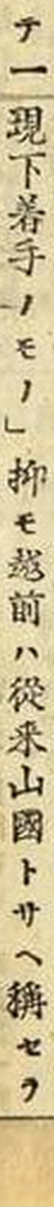現下着手ノモノ」抑モ越前ハ從来山國トサヘ稱セラ
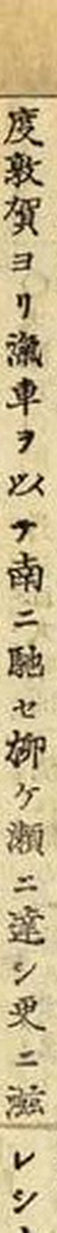度敦賀ヨリ滊車ヲ以テ南ニ馳セ柳ケ瀬ニ達シ更ニ滋
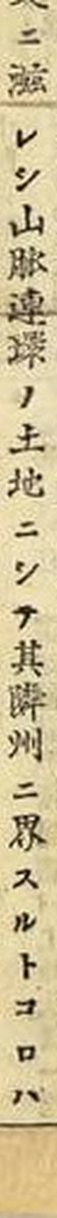レシ山脈連環ノ土地ニシテ其隣州ニ界スルトコロハ
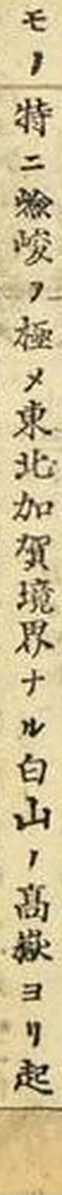特ニ險峻ヲ極メ東北加賀境界ナル白山ノ髙嶽ヨリ起

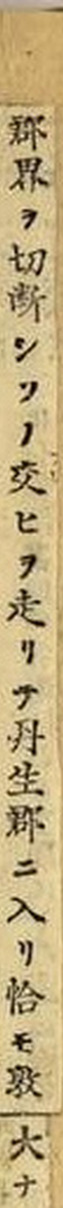郡界ヲ切断シソノ交ヒヲ走リテ丹生郡ニ入リ恰モ敦
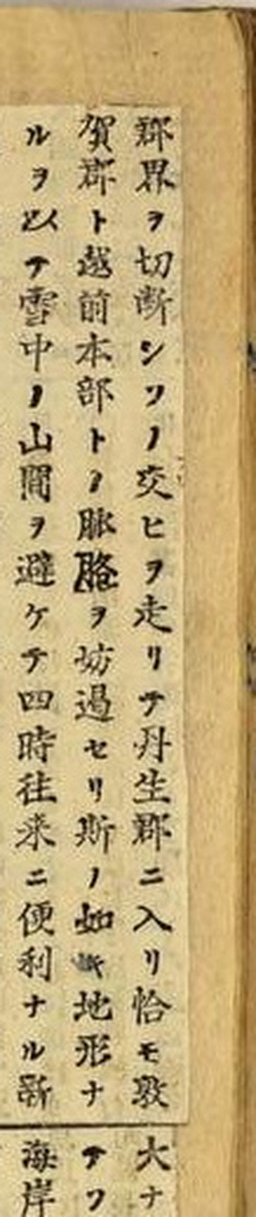郡界ヲ切断シソノ交ヒヲ走リテ丹生郡ニ入リ恰モ敦
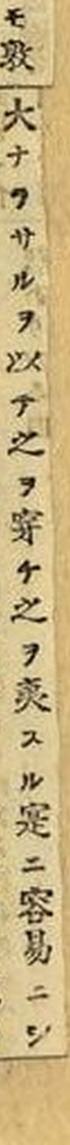大ナラサルヲ以テ之ヲ穿チ是ヲ変スル寔ニ容易ニシ
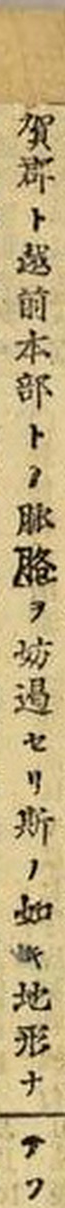賀郡ト越前本部トノ脈胳ヲ妨過セリ斯ノ如キ地形ナ
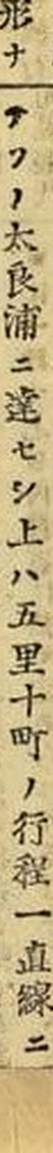テソノ太良浦ニ達セシ上ハ五里十里ノ行程一直線ニ
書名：温古集 五巻
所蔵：福井県文書館 Fukui Prefectural Archives
